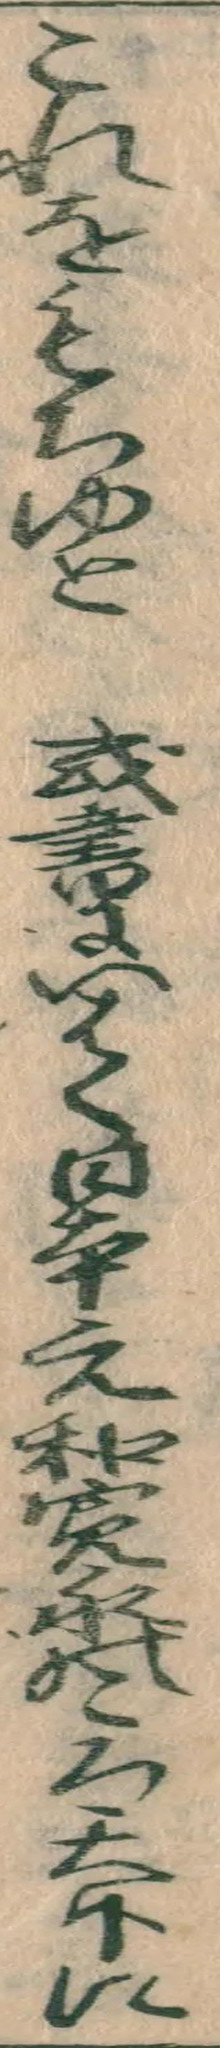これをもちゆと或書にいはく日本元和寛永のころ天下に
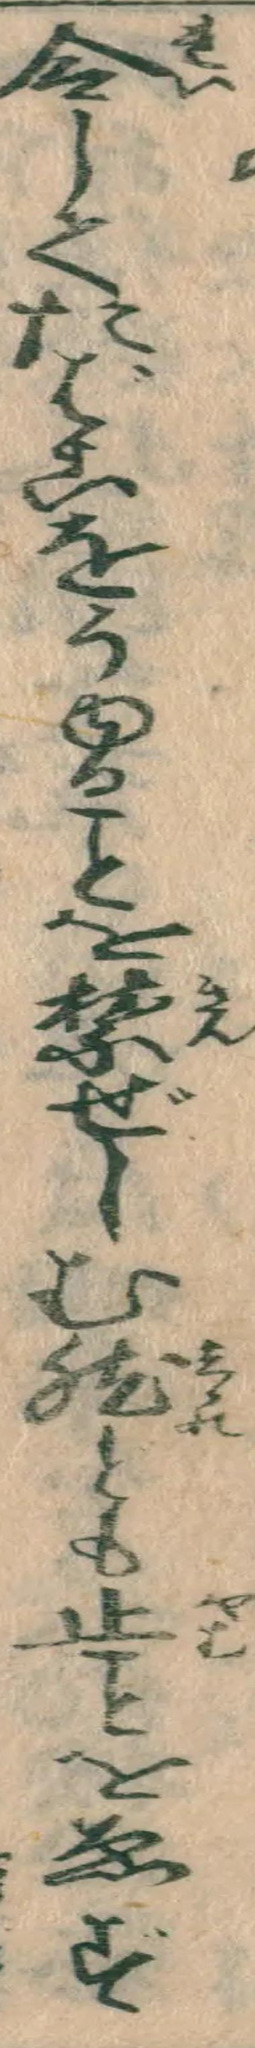令してたばこをうゆることを禁ぜしむ然とも止ことをゑず
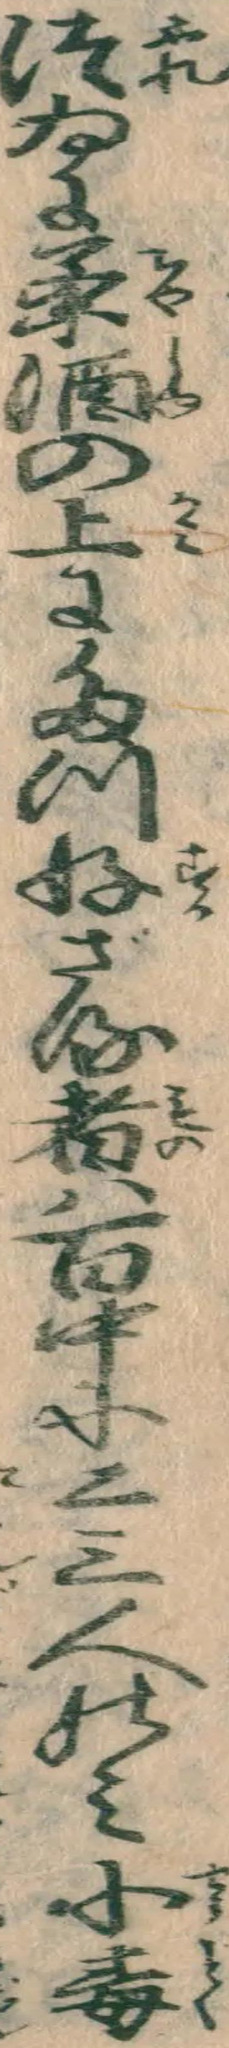つゐに茶酒の上にたつ好ざる者は百中に二三人のみ小毒
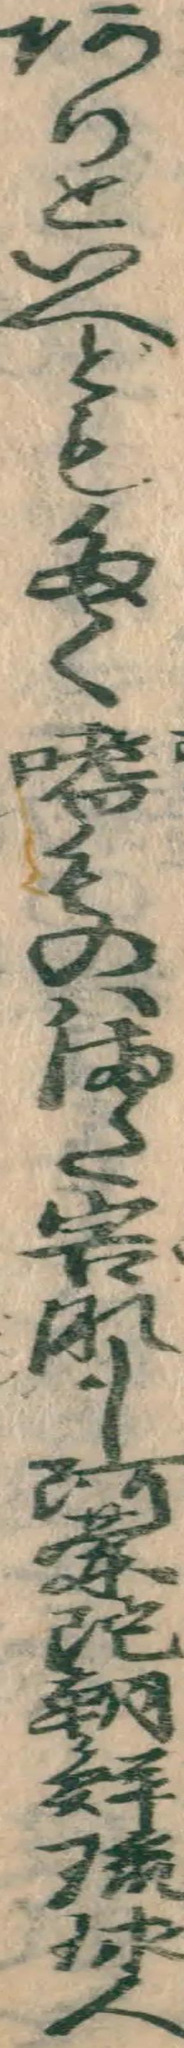ありといへども多く嗜ものはまた害なし阿蘭陀朝鮮琉球人
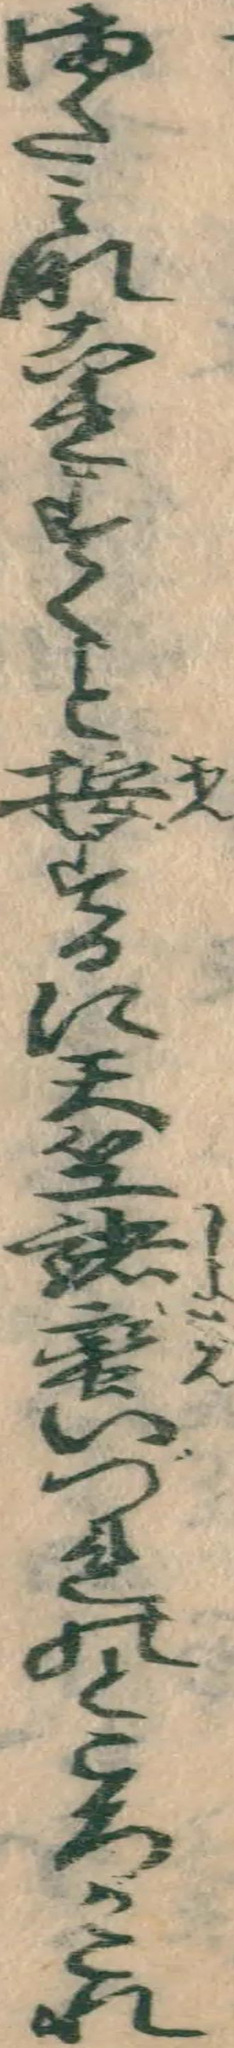またみなこれすくと按するに天竺諸蛮いづれのところかこれ
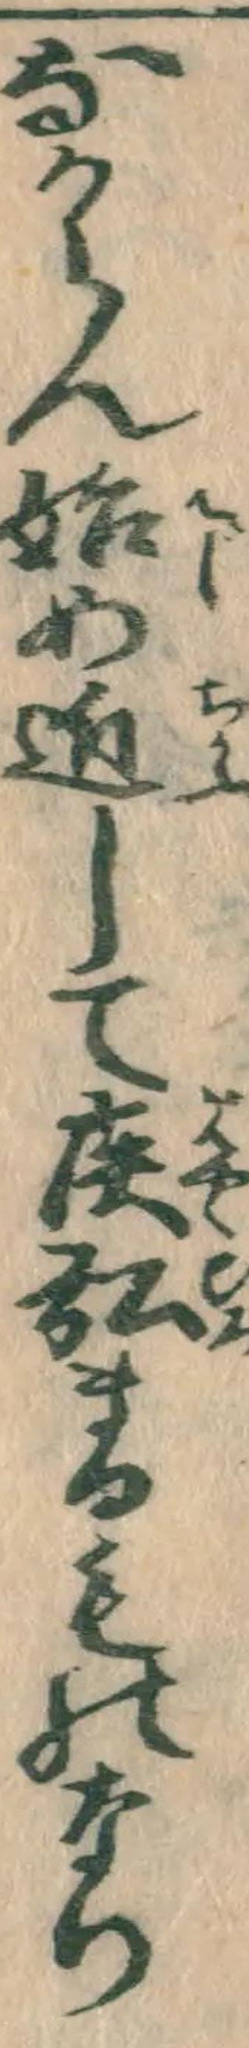なからん始め近して疾弘まるものなり

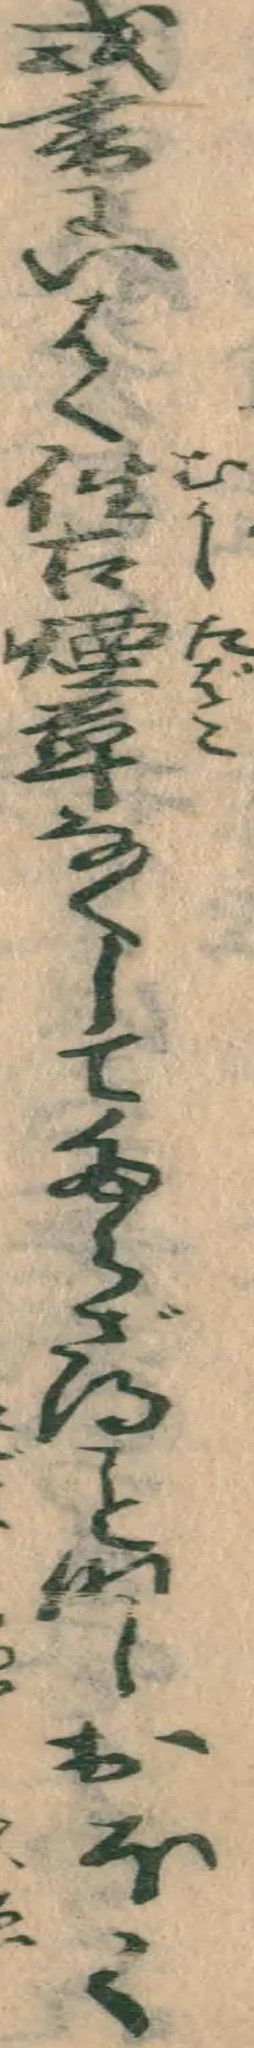或書にいはく往古煙草なくしてたらざることなしおほく
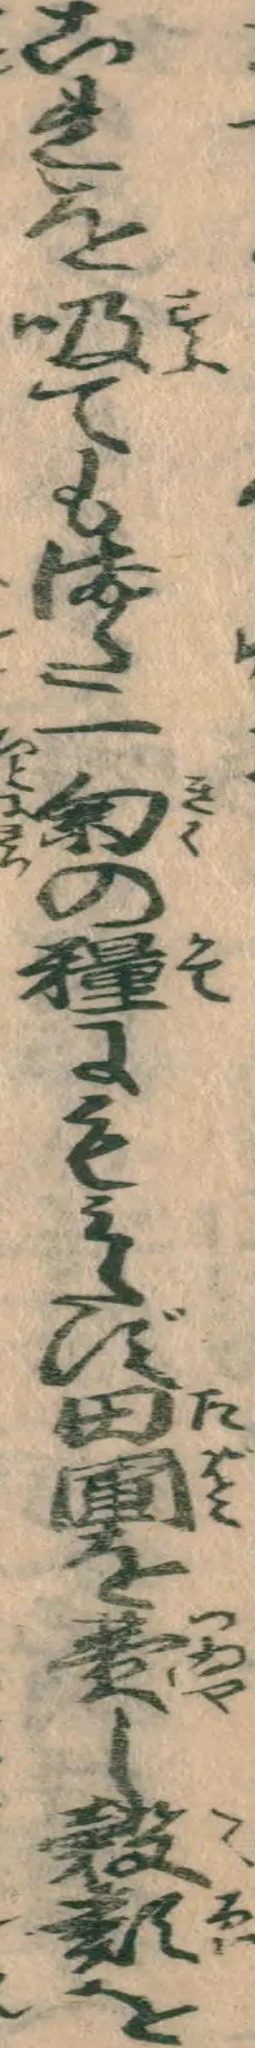これを吸てもまた一匊の糧にもみたず田圃を費し穀類を
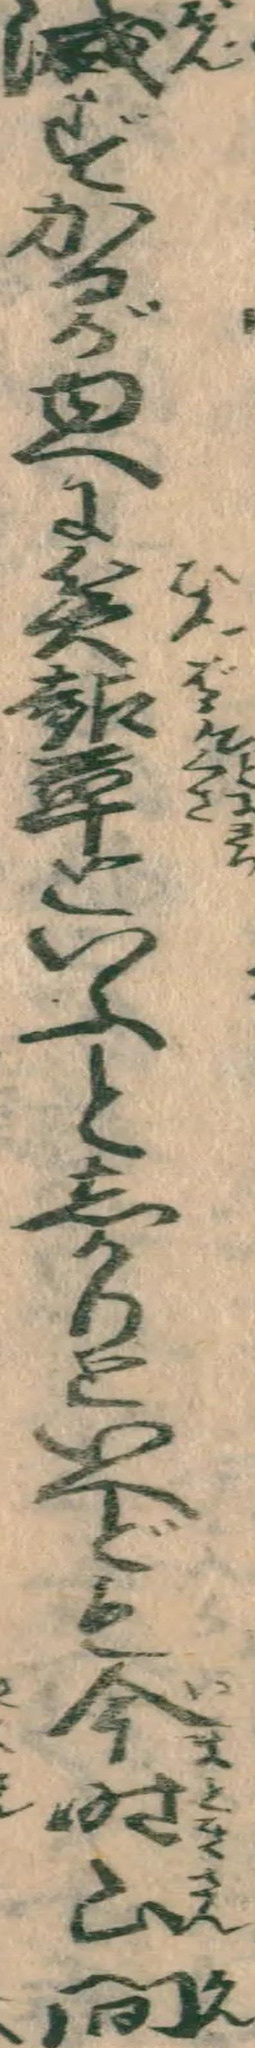減ずかるがゆへに貧報草といふとしかりといへども今時山間
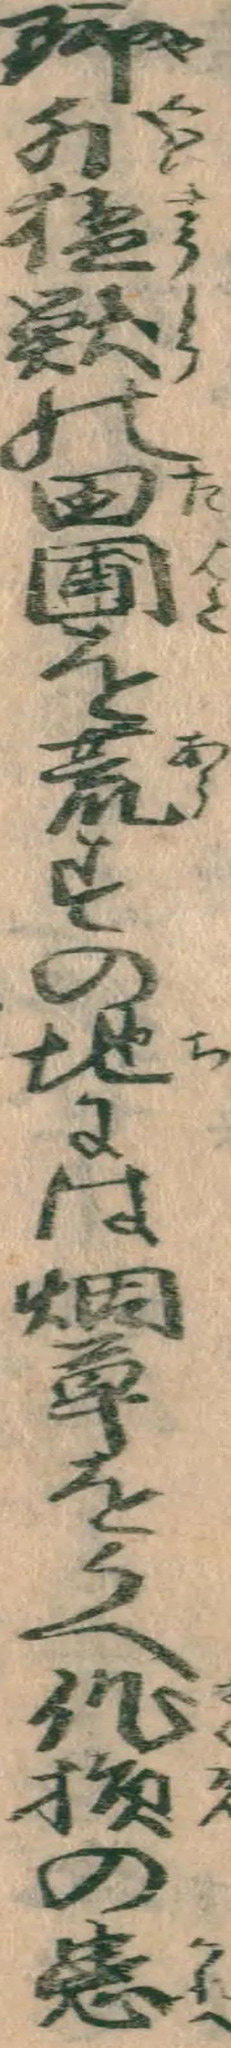野外猛獣の田圃を荒すの地には烟草をうへ作損の患
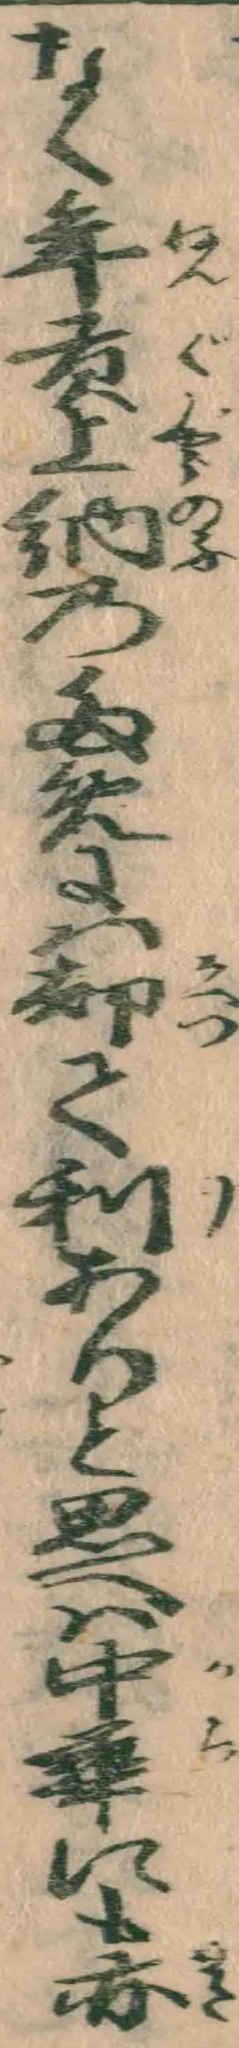なく年貢上納のためには却て利ありと思へば中華にも亦
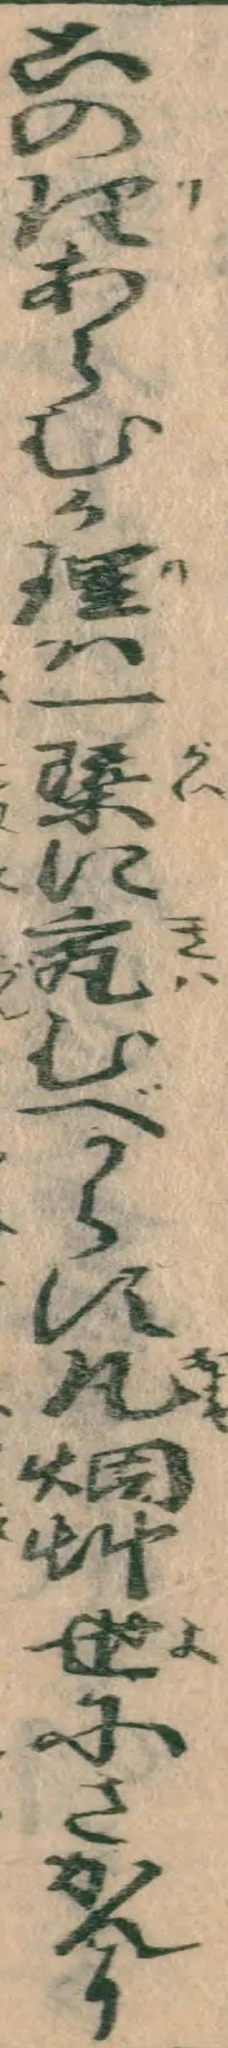この理あらむか理は一概に究むべからす凡烟草世にさかんに
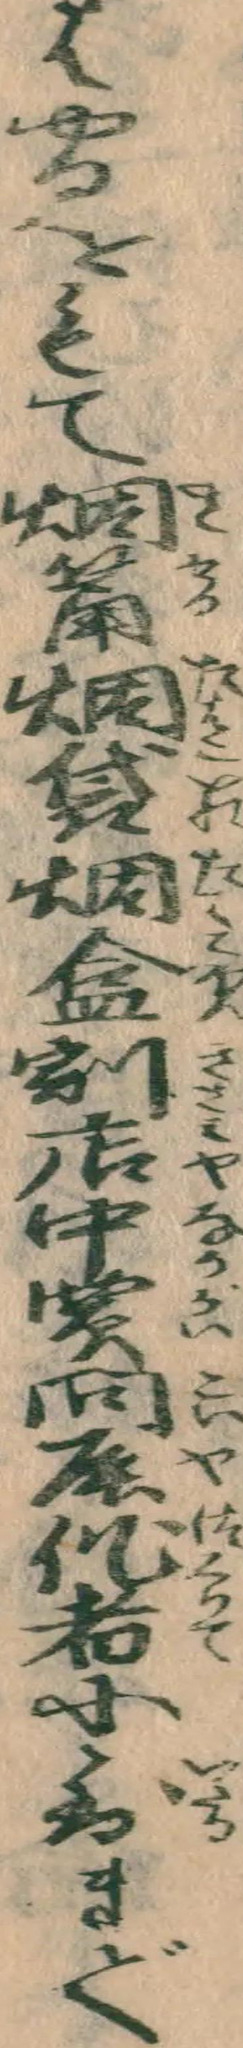はやるをもて烟筩烟袋烟盆割店中買問屋作者に至まで
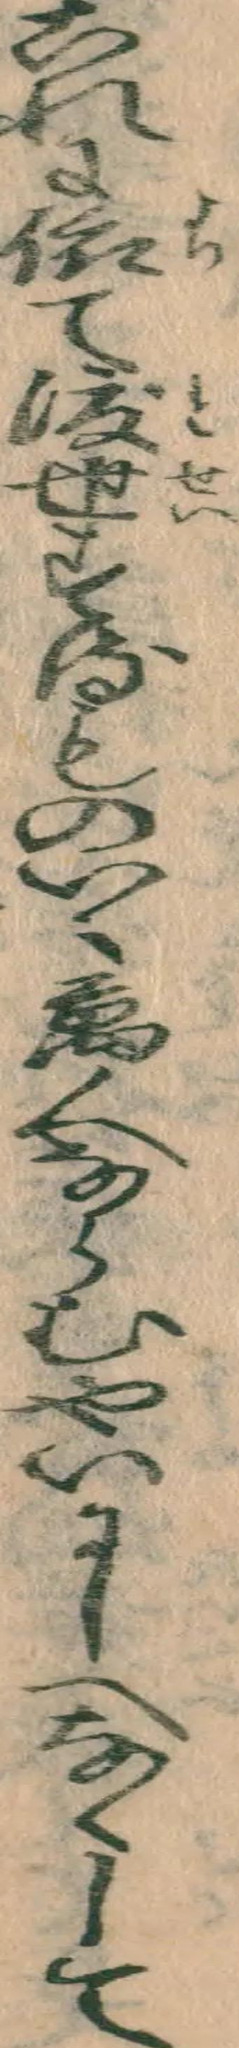これに依て渡世するものいく万人ならむやいにしへなくして
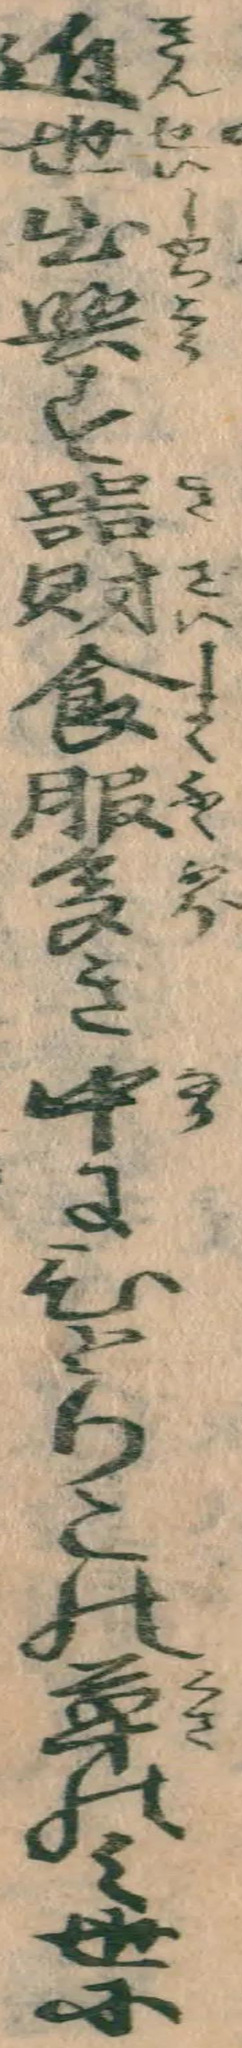近世出興す器財食服多き中にひとりこの草のみ世に
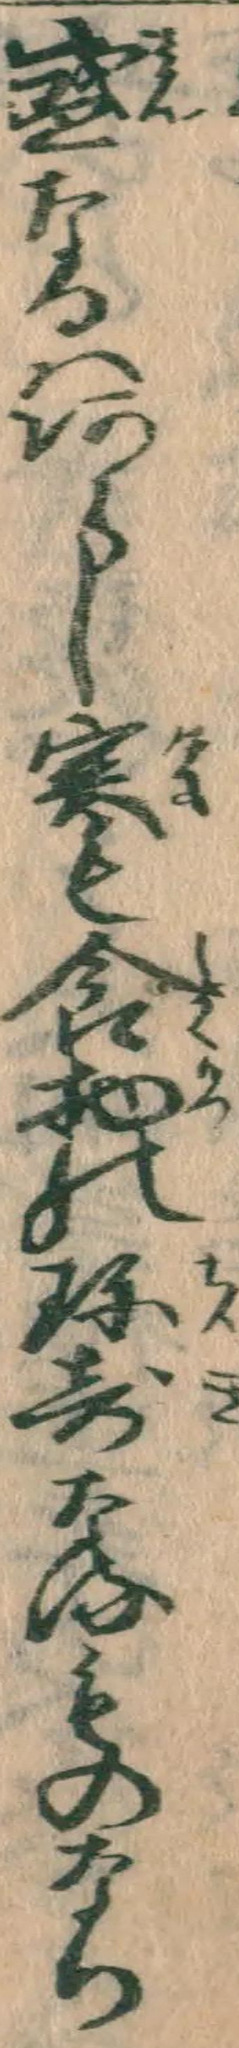盛なるはあらし実も食物の珍奇なるものなり
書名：煙草記
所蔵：国立国会図書館 National Diet Library, JAPAN
